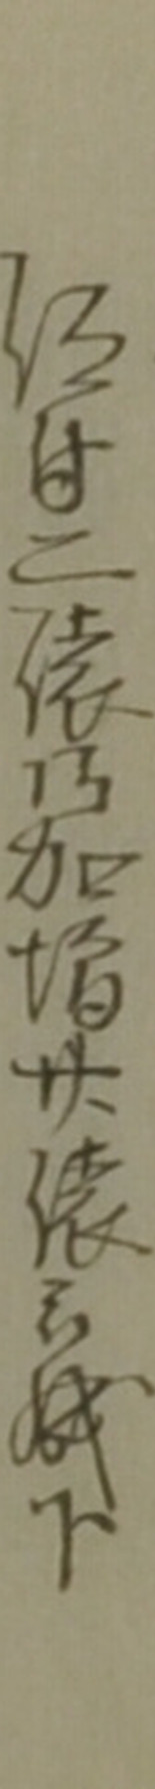仰付二俵御加増廿俵被成下
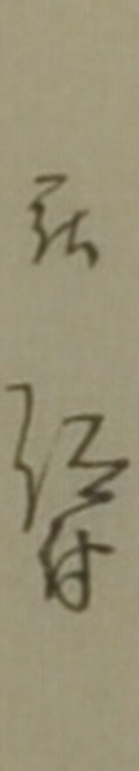被仰付
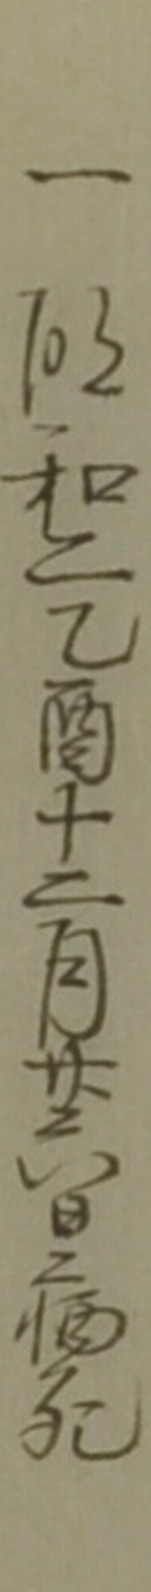一明和二乙酉十二月廿六日病死
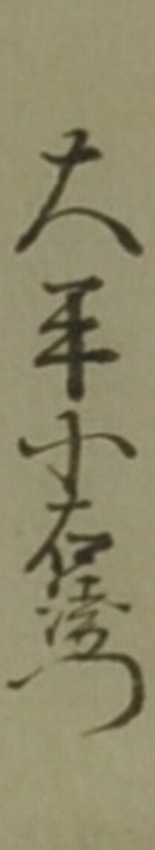大平小右衛門
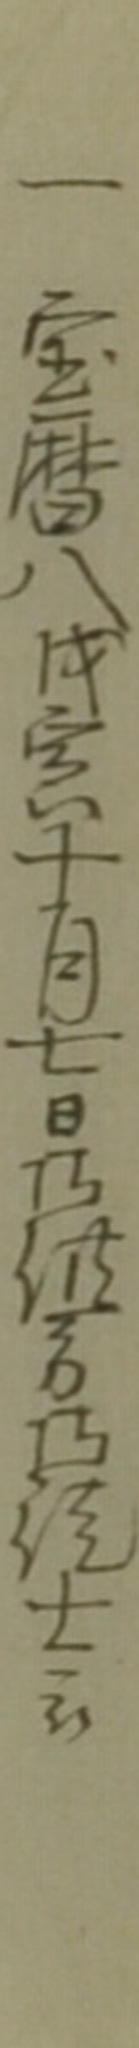一宝暦八戊寅十月七日御供方御徒士被
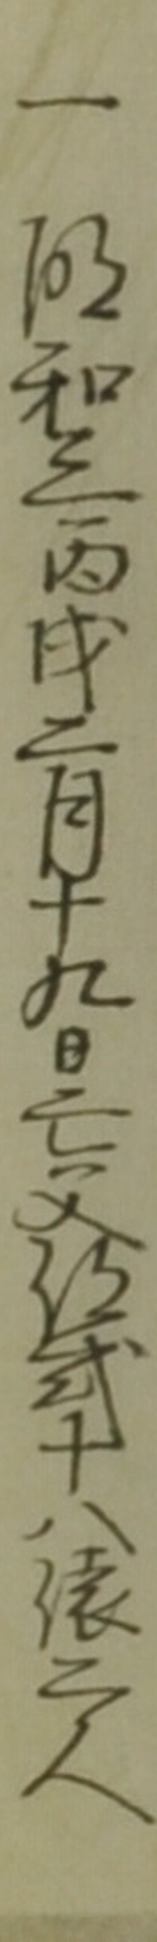一明和三丙戌二月十九日亡父跡式十八俵二人
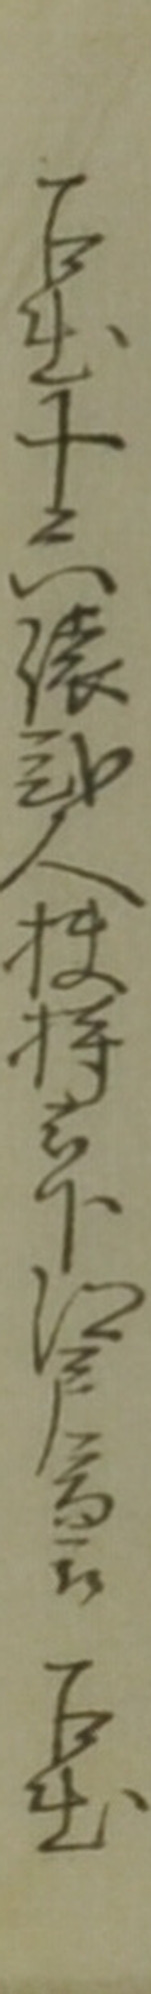召出十六俵弐人扶持被下江戸ニ而被召出

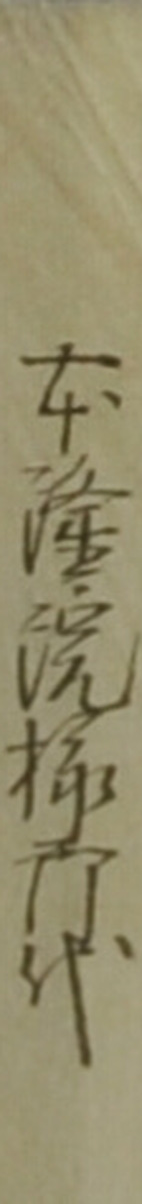本隆院様御代
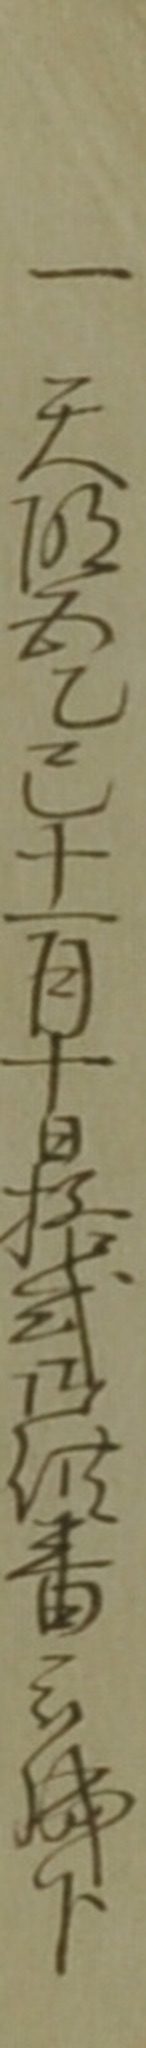一天明五乙巳十一月十日格式御供番被成下
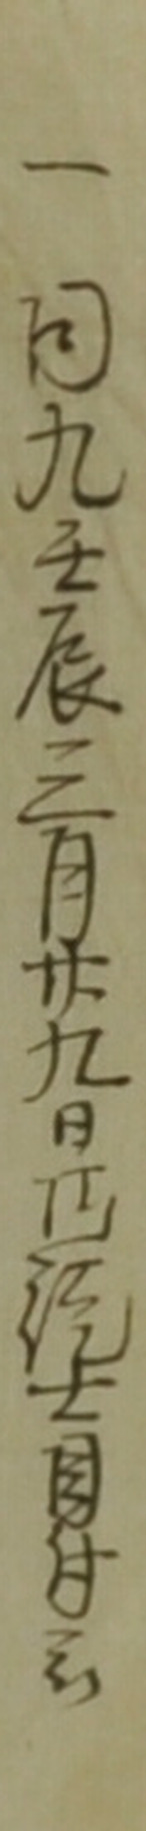一同九壬辰三月廿九日御徒士目付被
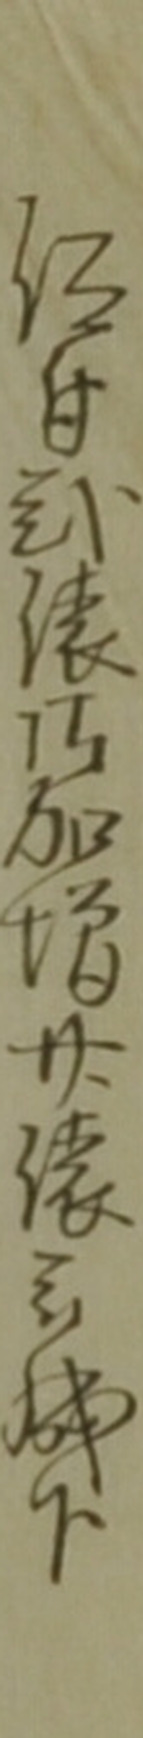仰付弐俵御加増廿俵被成下
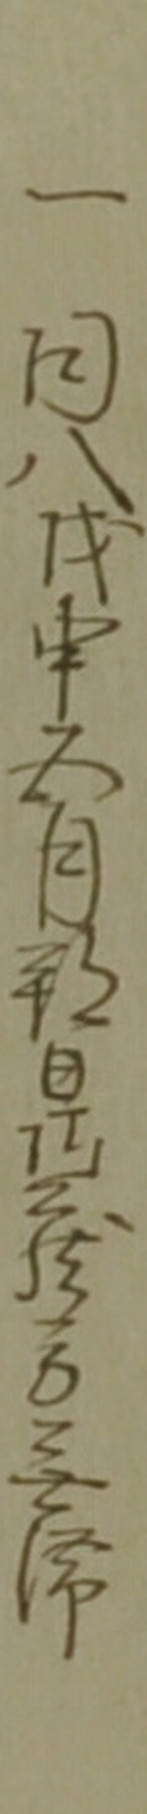一同八戌申五月朔日御蔵方無滞
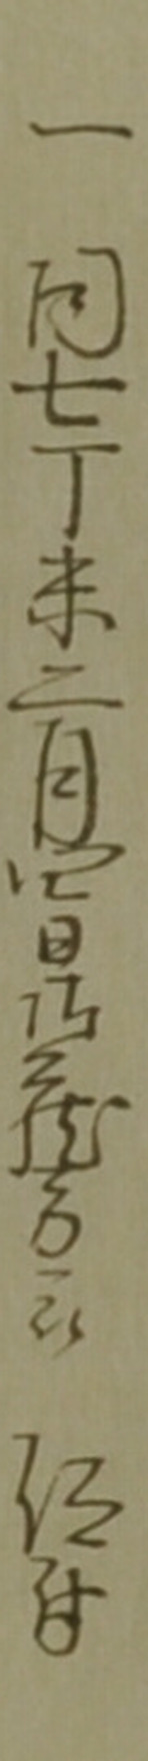一同七丁未二月四日御蔵方被仰付
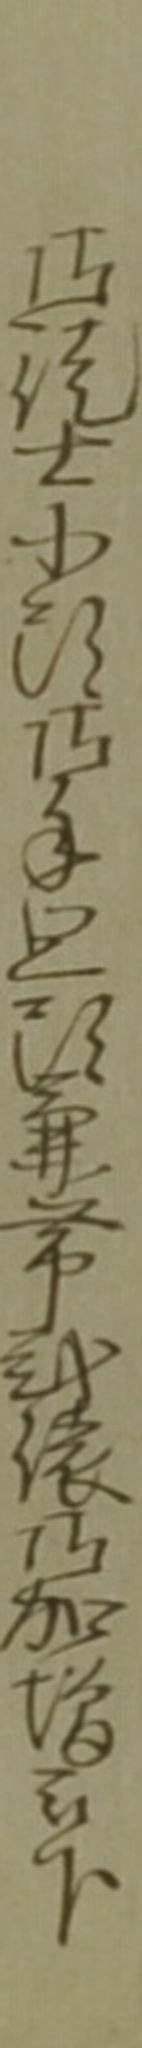御徒士小頭御手廻頭兼帯弐俵御加増被下
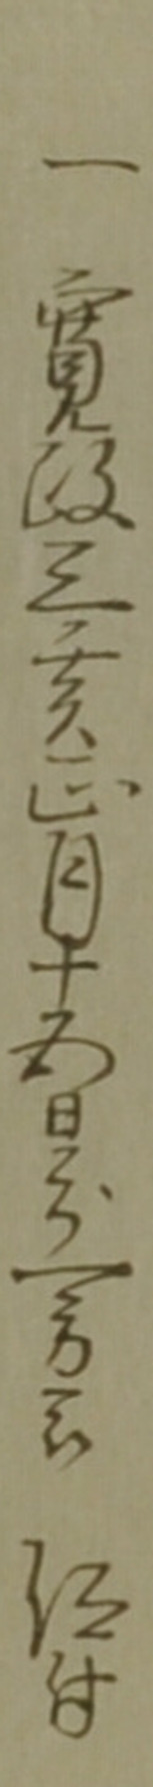一寛政三亥正月十五日分一方被仰付
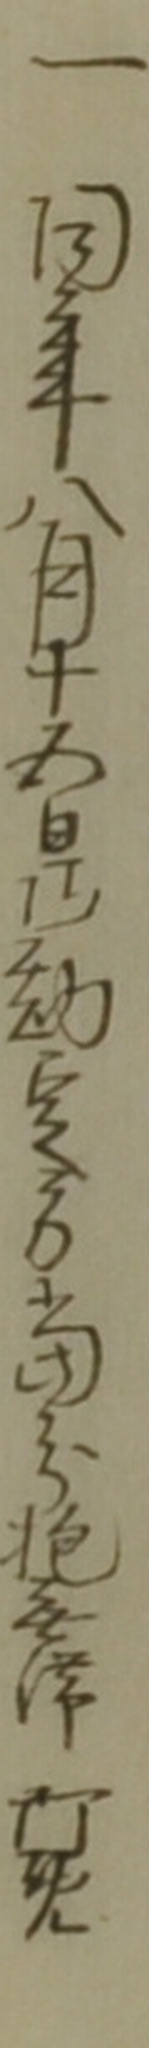一同年八月十五日御勘定方当分抱無滞御免
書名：無足諸士勤仕録（六）
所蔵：伊那市立高遠町図書館・合同会社AMANE
